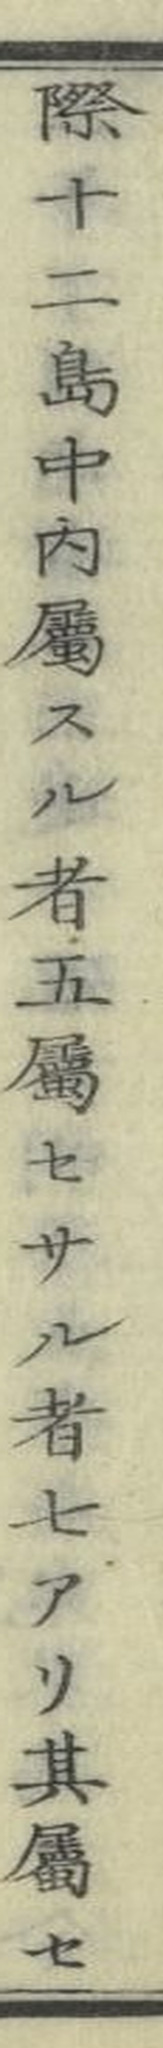際十二島中內屬スル者五屬セサル者アリ其屬セ
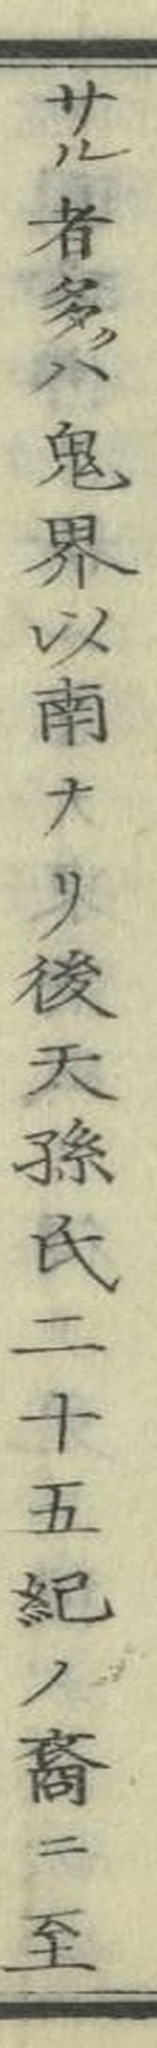サル者多ハ鬼界以南ナリ後天孫氏二十五紀ノ裔ニ至
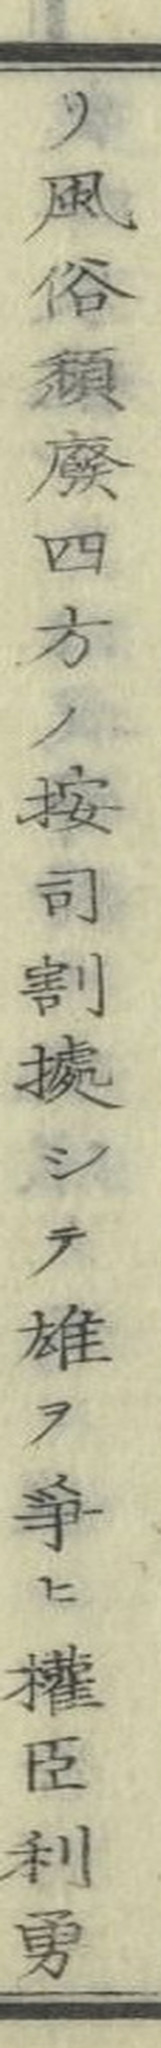リ風俗頽廃四方ノ按司割㨿シテ雄ヲ爭ヒ權臣利勇
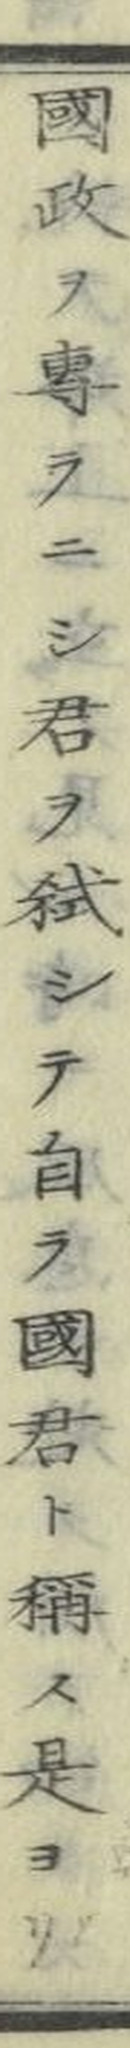國政ヲ專ラニシ君ヲ弑シテ自ラ國君ト稱ス是ヨリ
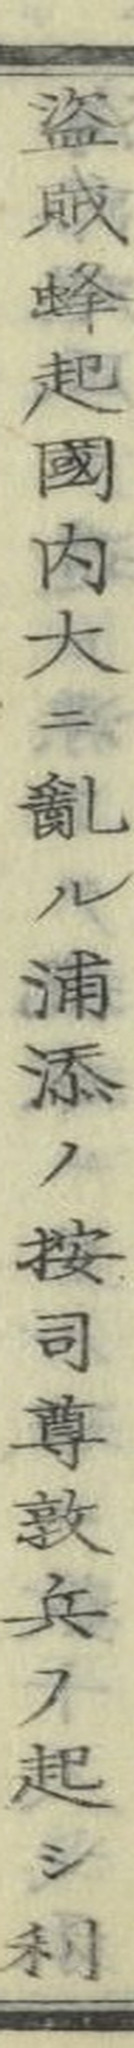盜賊峰起國內大ニ亂ル浦添ノ按司尊敦兵ヲ起シ利
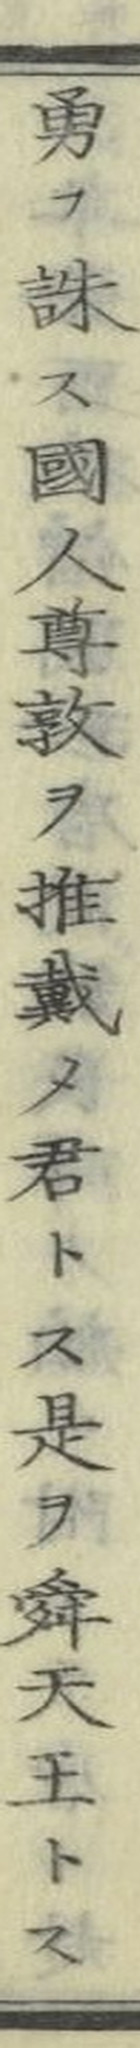勇ヲ誅ス國人尊敦ヲ推戴シテ君トス是ヲ舜天王トス
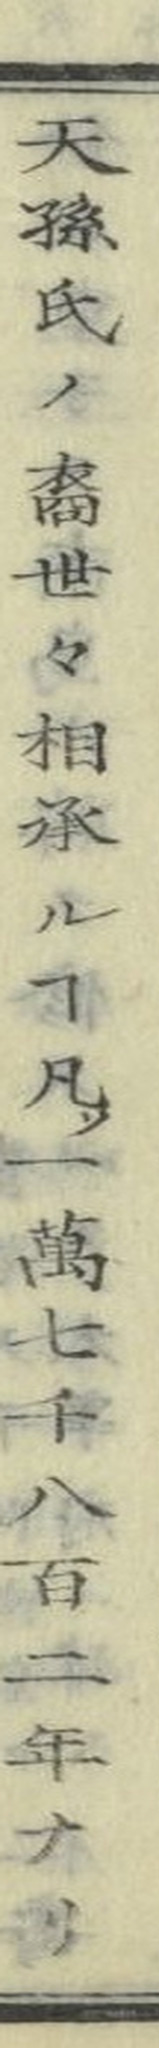天孫氏ノ裔世々相承ルコト凡一萬七千八百二年ナリ
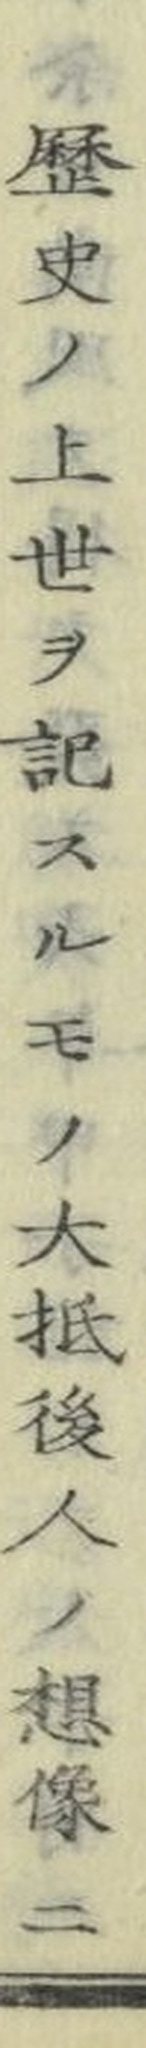歷史ノ上世ヲ記スルモノ大抵後人ノ想像ニ
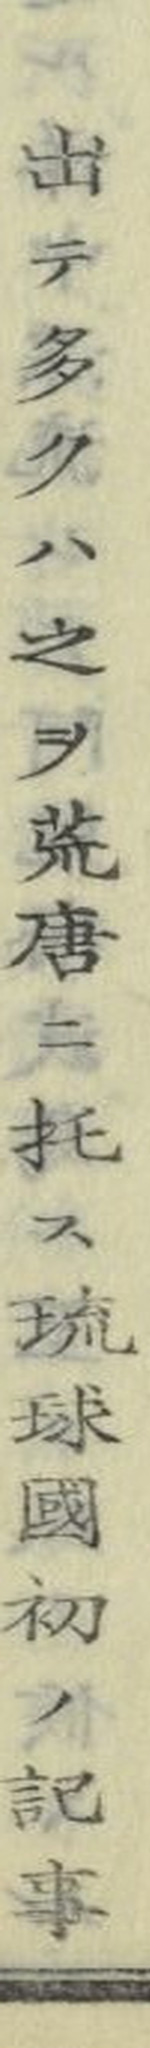出テ多クハ之ヲ唐ニ托ス琉球國初ノ記事
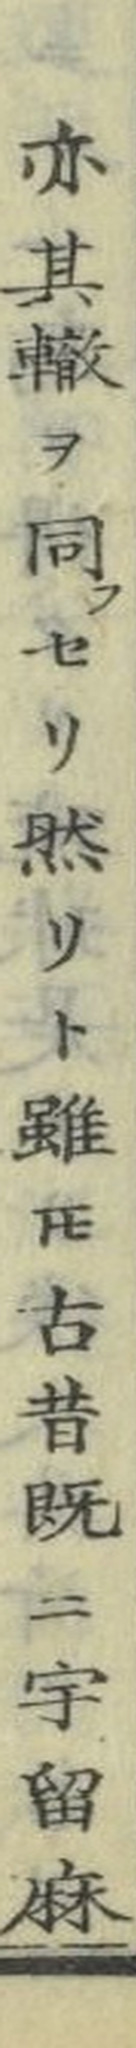亦其轍ヲ同セリ然リト雖トモ古昔既ニ宇留麻
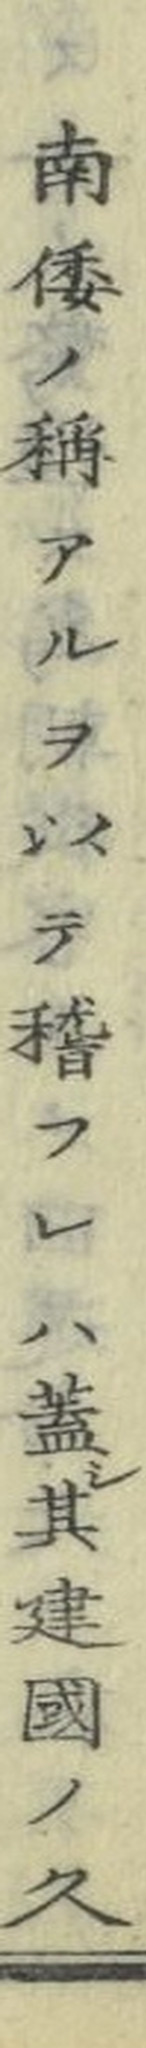南倭ノ稱アルヲ以テ稽フレハ蓋其建國ニ久
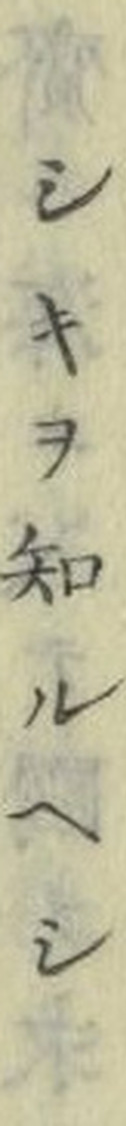シキヲ知ルヘシ
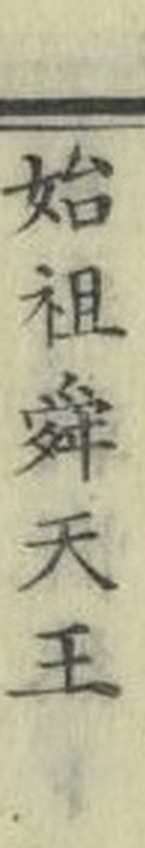始祖舜天王
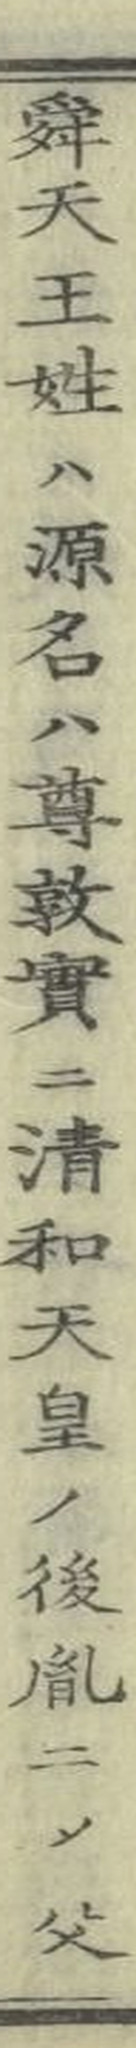舜天王姓ハ源名ハ尊敦實ニ清和天皇ノ後胤ニシテ父
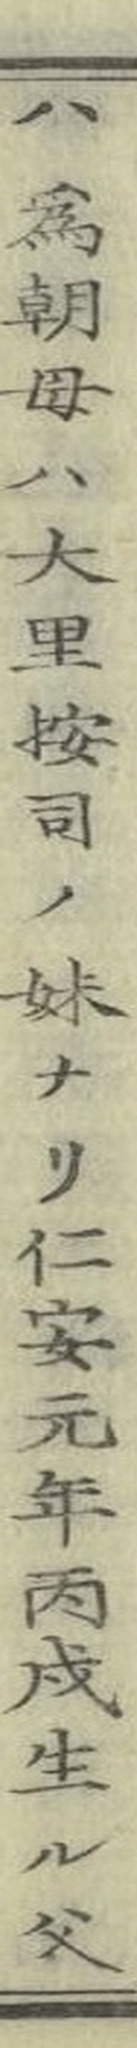ハ爲朝母八大里按司ノ妹ナリ仁安元年丙戌生ル父
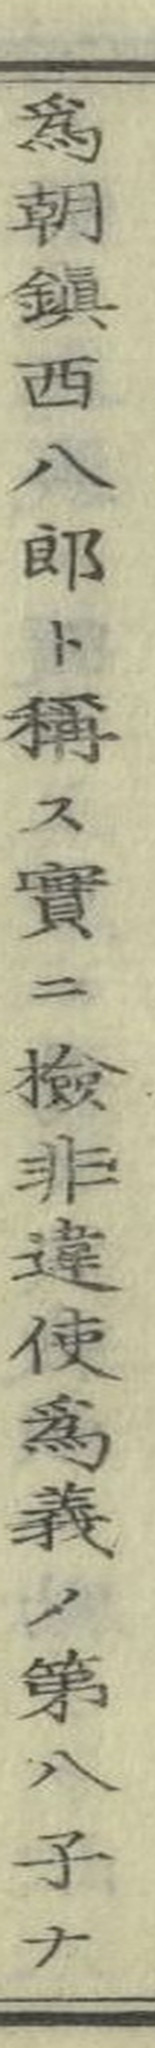爲朝鎭西八郎ト稱ス實ニ撿非違使爲義ノ第八子ナ
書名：琉球藩史 一之巻
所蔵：University of the Ryukyus Library
